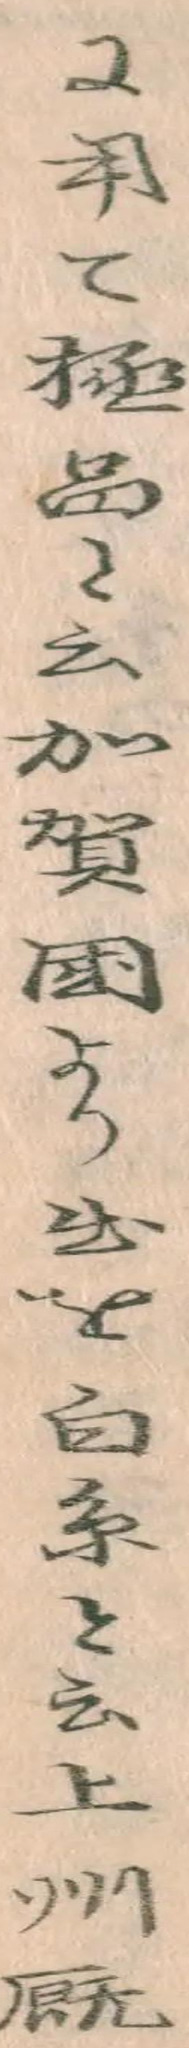に用て極品と云加賀国より出を白糸と云上州厩
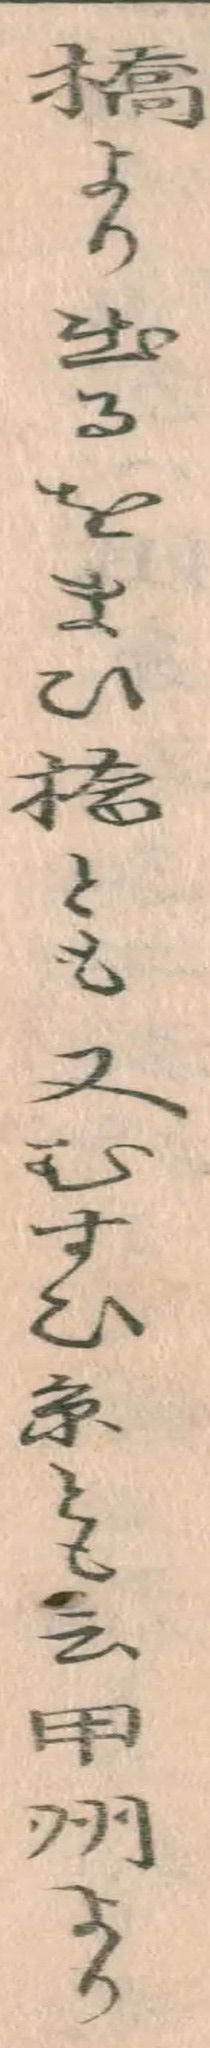橋より出るをまひ橋とも又むすひ糸とも云甲州より
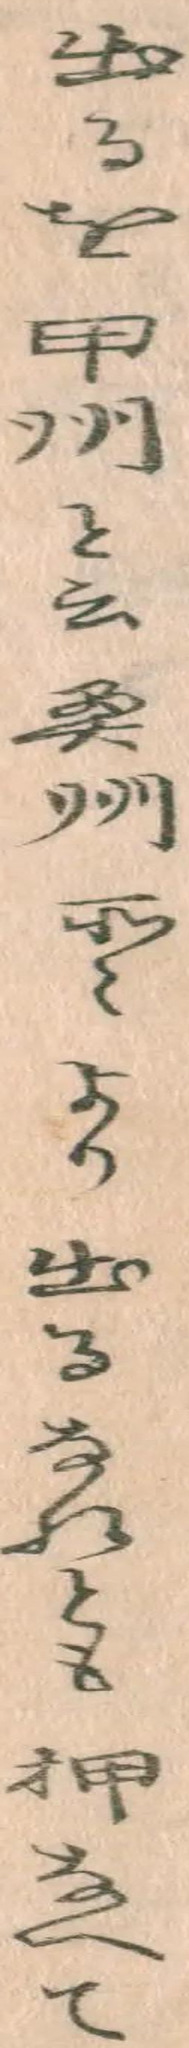出るを甲州と云奥州所々より出るなれとも押なへて
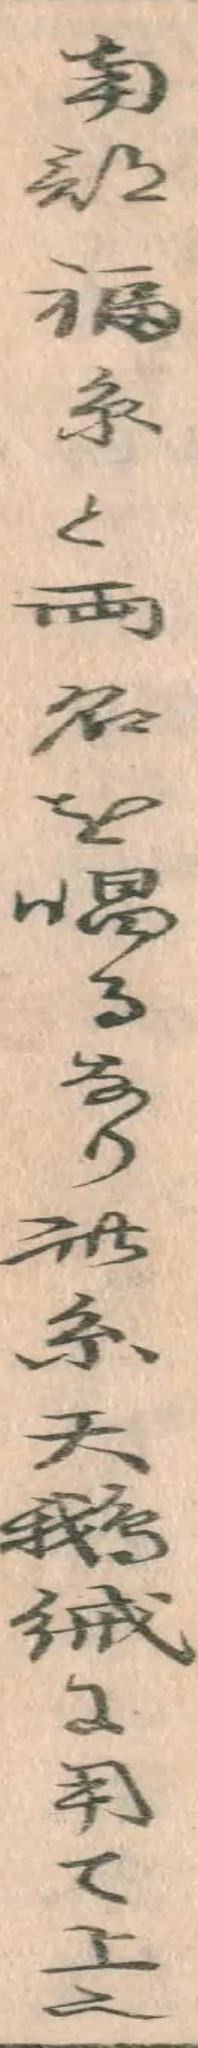南部福糸と両名を唱るなり此糸天鵝絨に用て上也
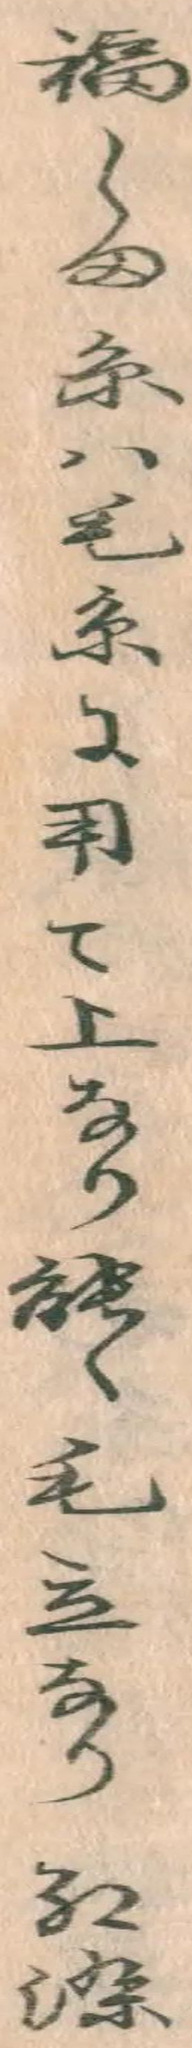福しま糸は毛糸に用て上なり能く毛立なり紅染
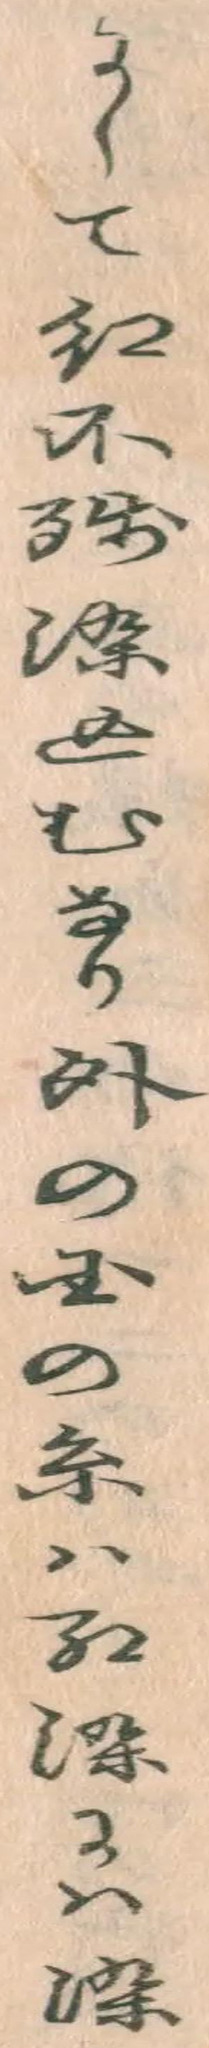にして紅不残染込むなり外の国の糸は紅染には染
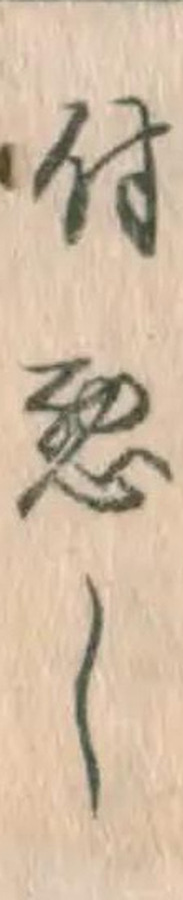付悪し
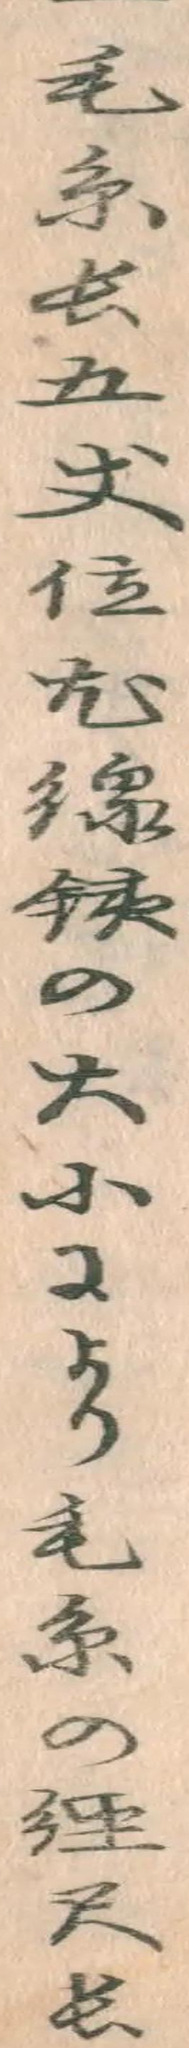一毛糸長五丈位尤線鉄の大小により毛糸の経尺長
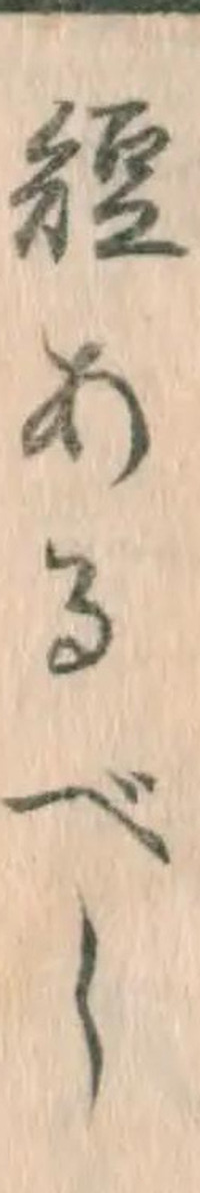短あるべし
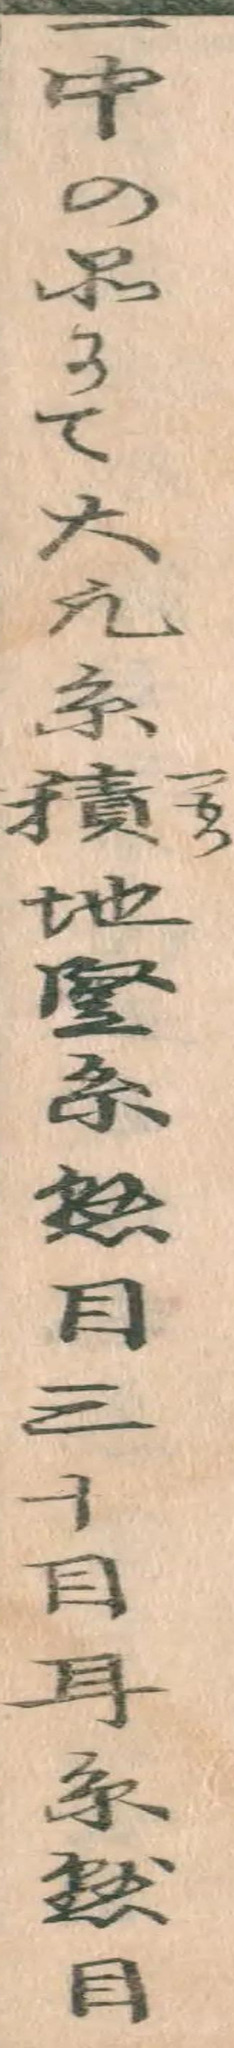一中の品にて大凡糸積地竪糸懸目三十目耳糸懸目

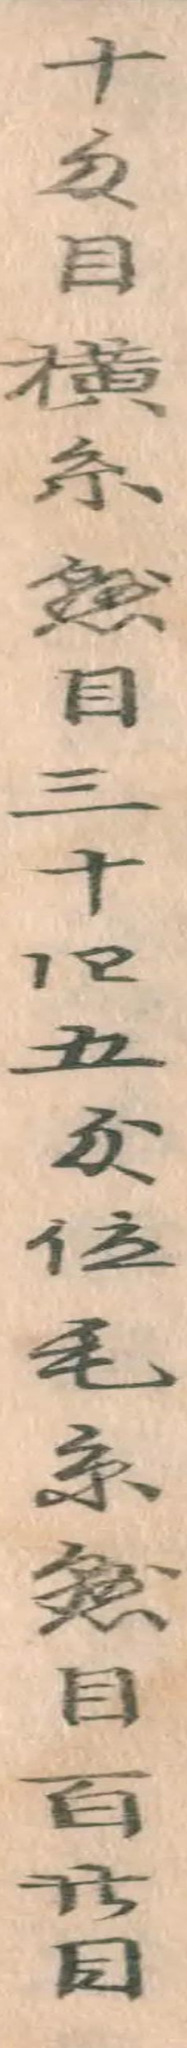十匁目横糸懸目三十四五匁位毛糸懸目百廿目
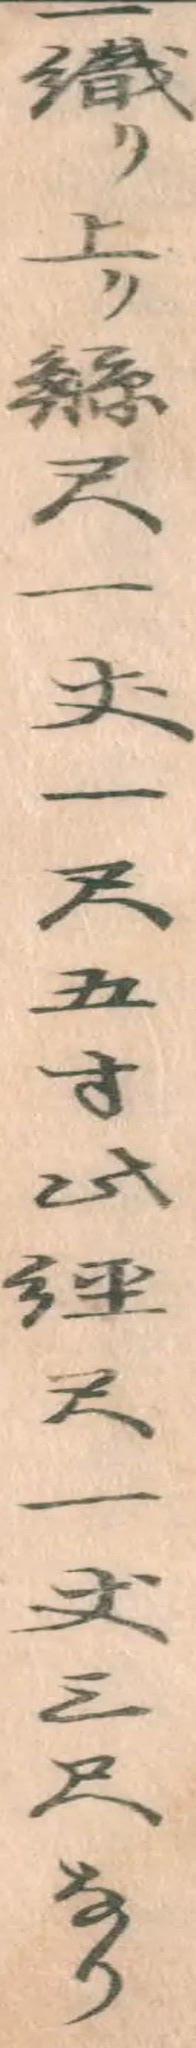一織り上り鯨尺一丈一尺五寸此経尺一丈三尺なり
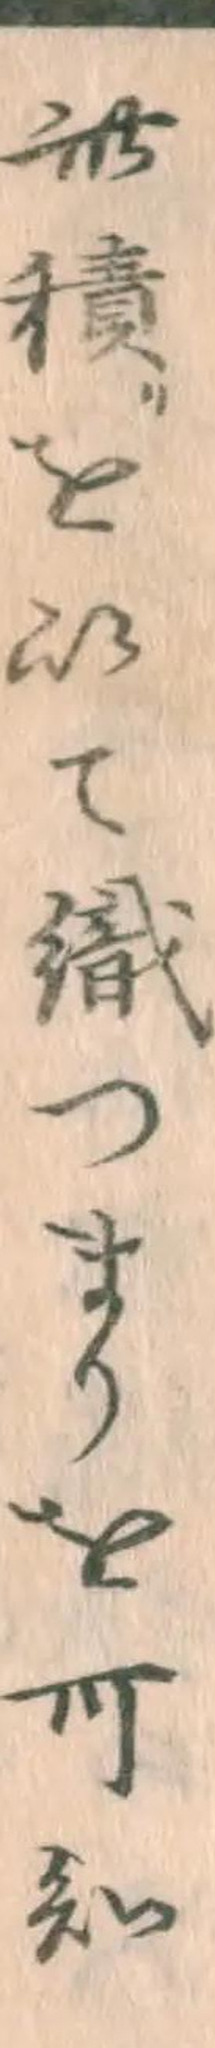此積りを以て織つまりを可知
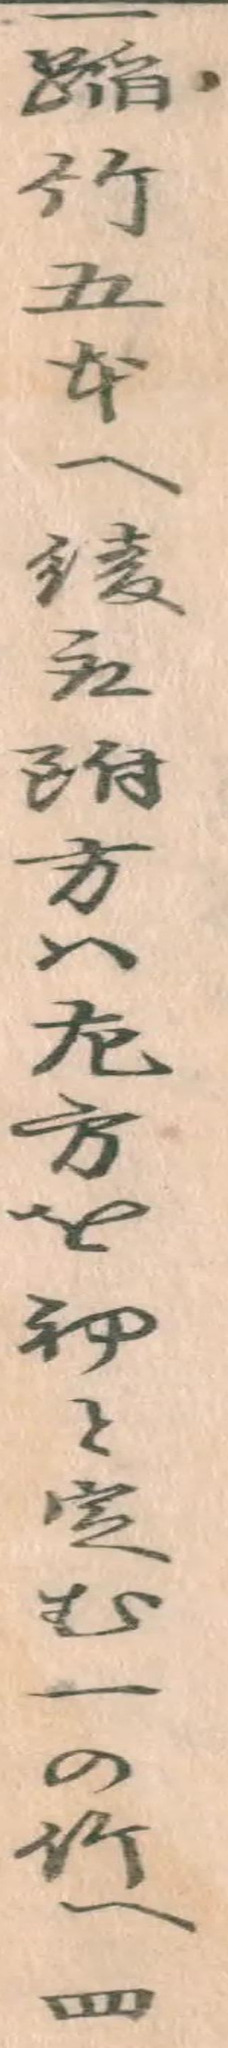一蹈竹五本へ綾取附方は左方を初と定む一の竹へ四
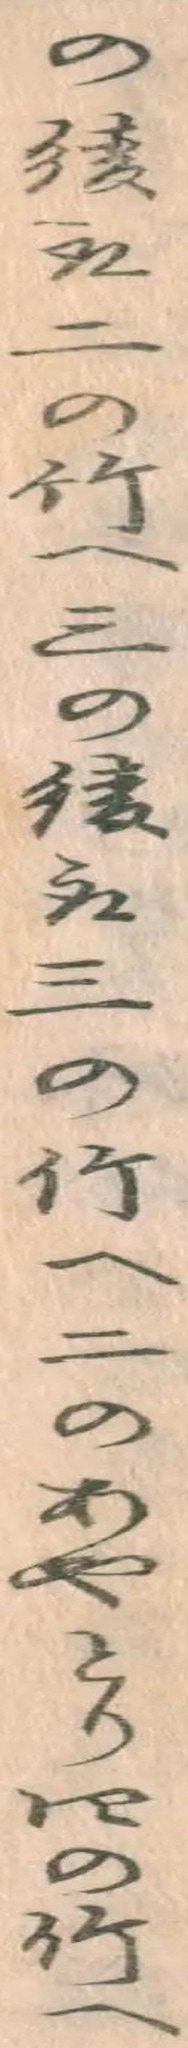の綾取二の竹へ三の綾取三の竹へ二のあやとり四の竹へ
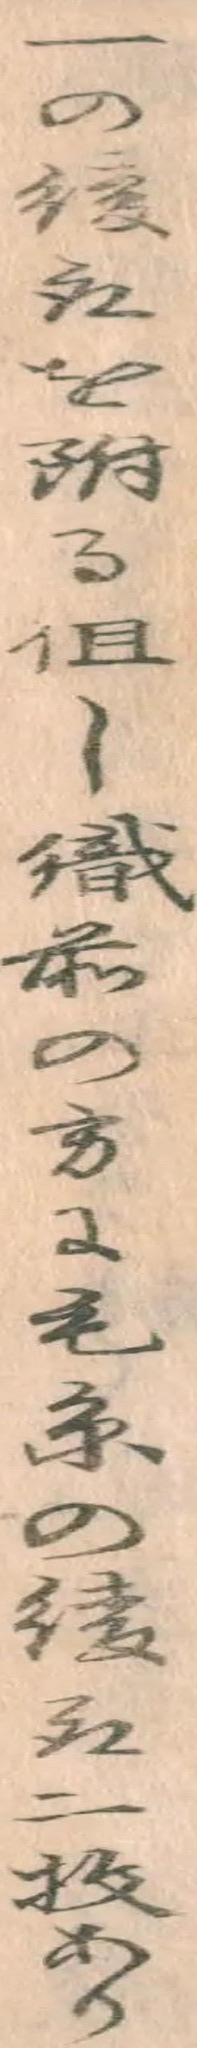一の綾取を附る但し織前の方に毛糸の綾取二枚あり
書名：機織彙編 5巻. [2]
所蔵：国立国会図書館 National Diet Library, JAPAN
